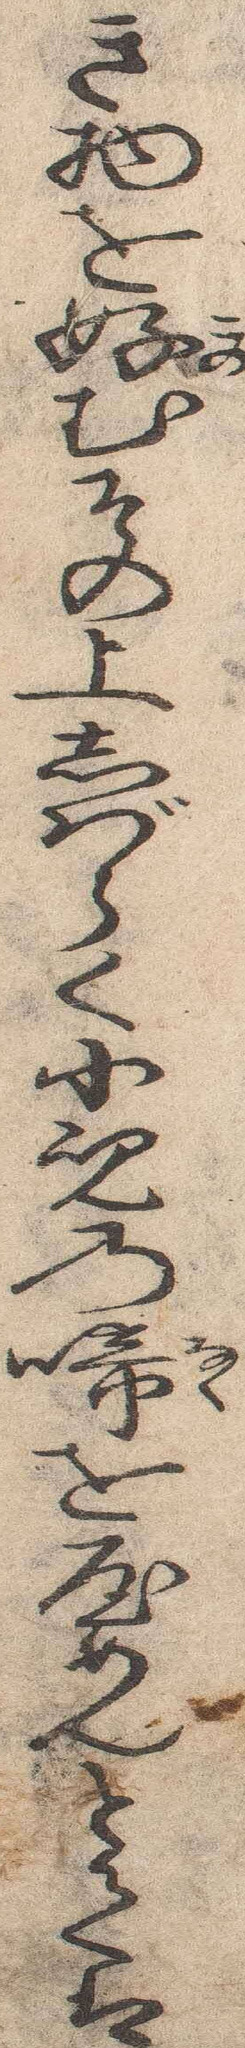き物を好むその上しばらく小児の啼をやめんとては

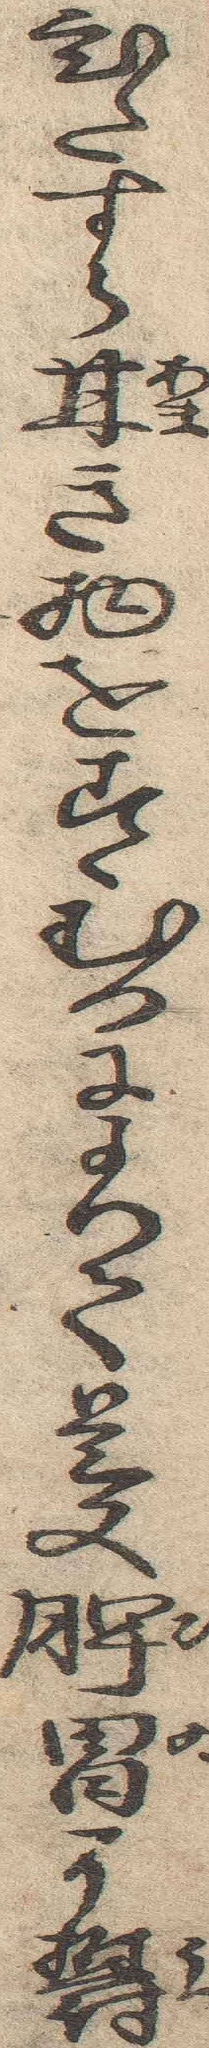ひたすら甘き物をすゝむるによりて是又脾胃に鬱
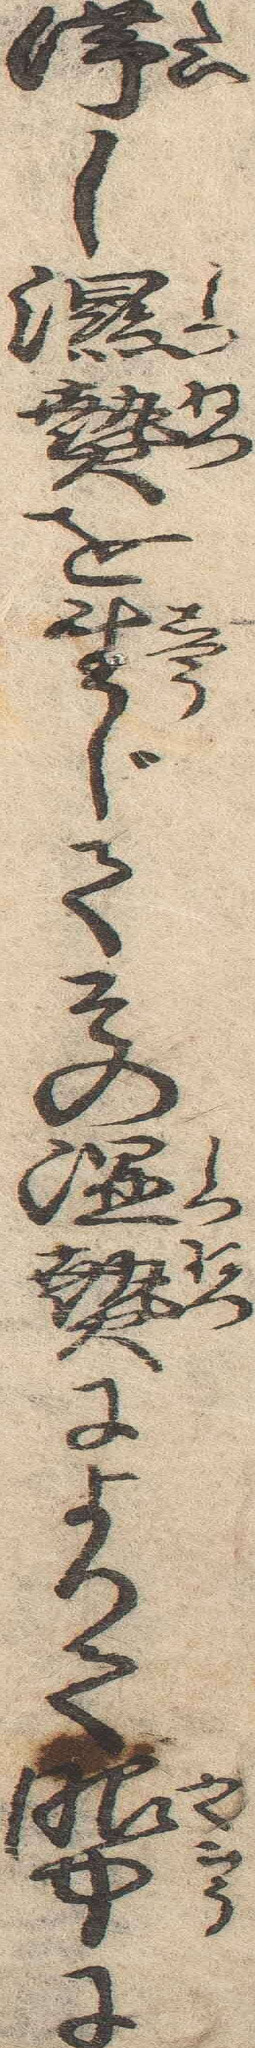滞し湿熱を生じてその湿熱によりて腹中に
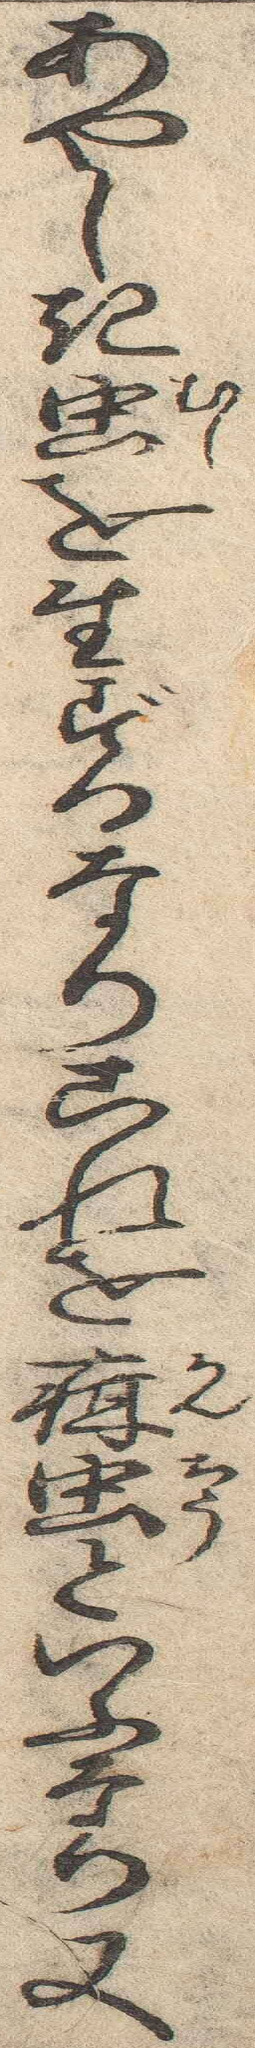あやしき虫を生ずるなりこれを疳虫といふなり又
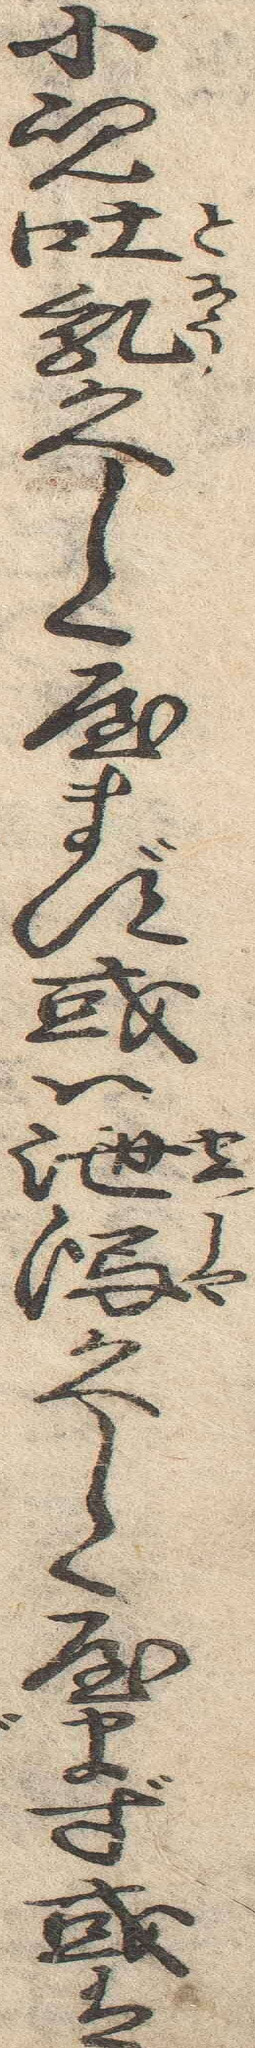小児吐乳久しくやまず或は泄瀉久しくやまず或は
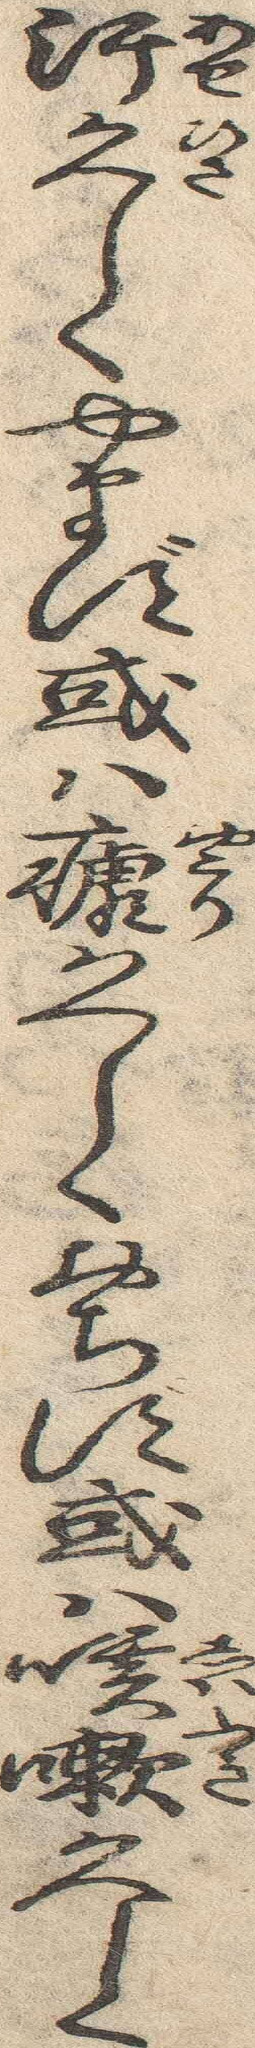汗久しくやまず或は瘧久しくおちす或は喉嗽久しく
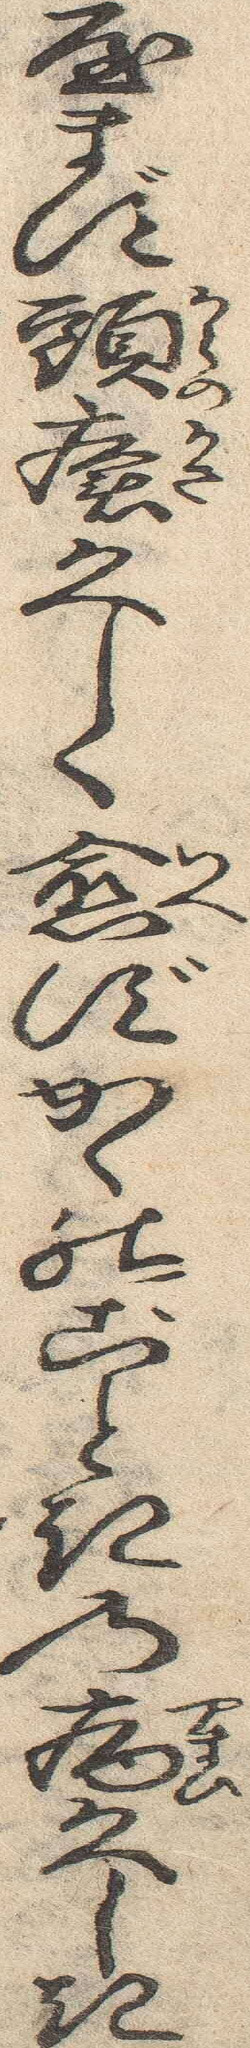やまず頭瘡久しく愈ずかくのごときの病久しき
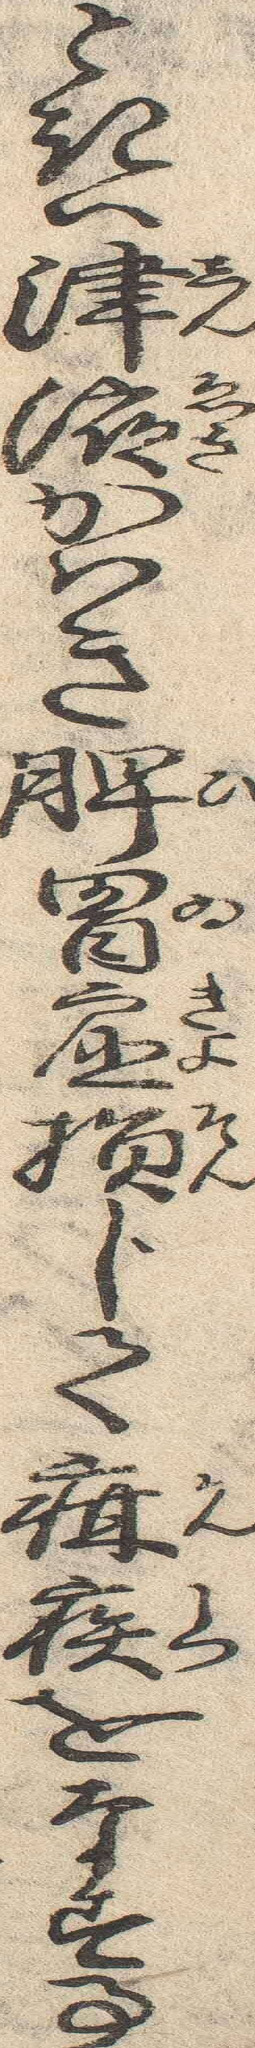ときは津液かはき脾胃虚損じて疳疾をなす事
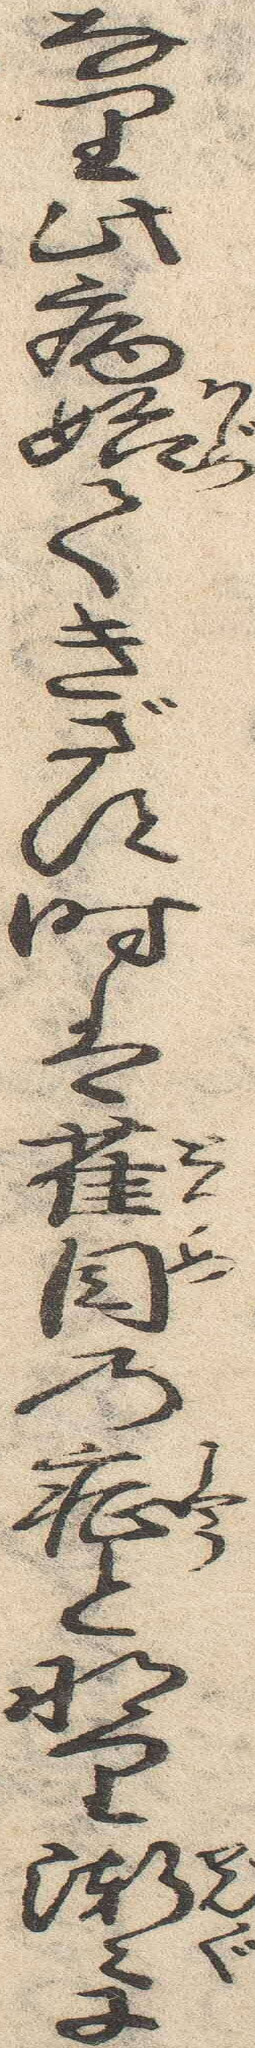なり此病始てきざす時は萑目の症となり漸々に
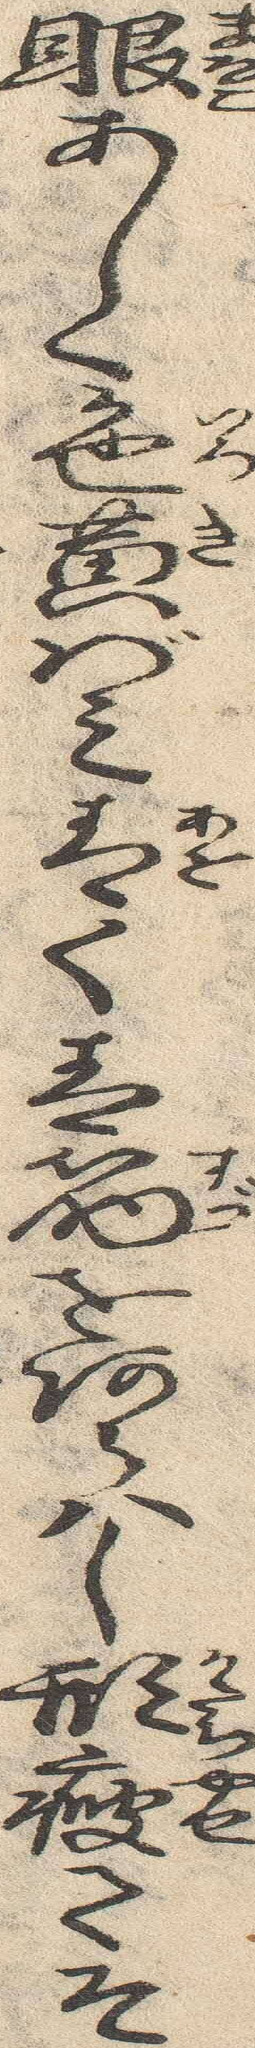眼あしく色黄ばみ青く青筋をあらはし形痩てそ
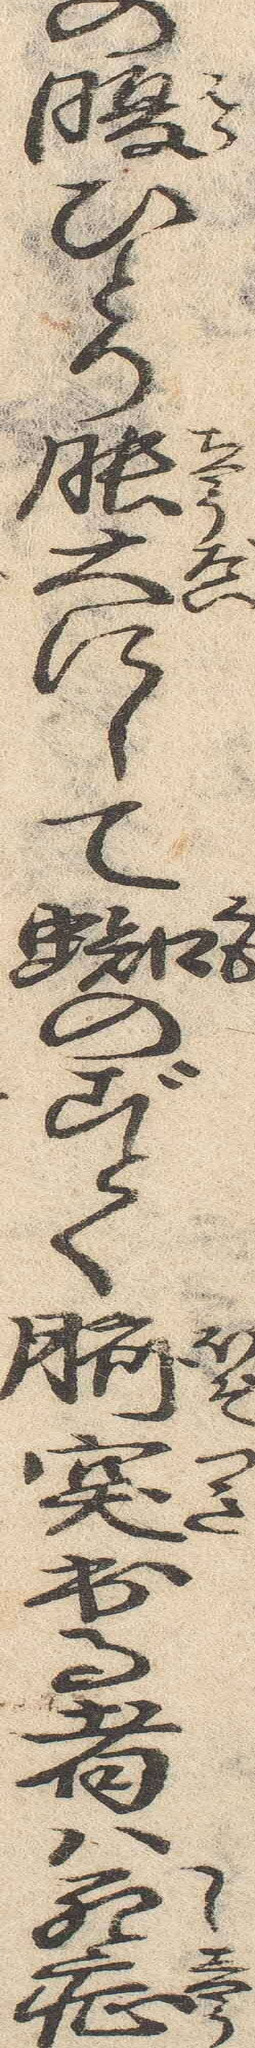の腹ひとり脹大にして蜘のごとく臍突出る者は死症
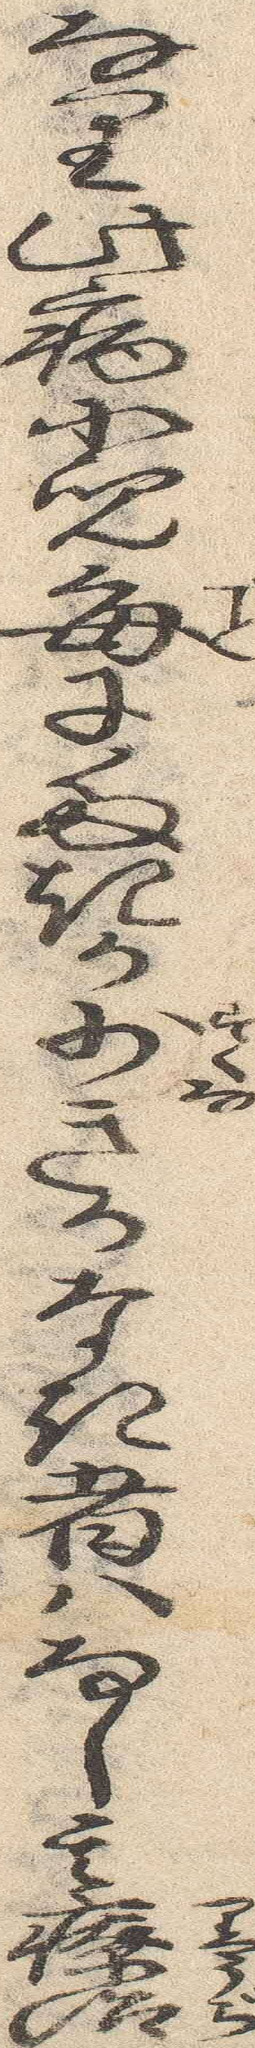なり此病小児毎に多きか少きかなき者はなし其療治
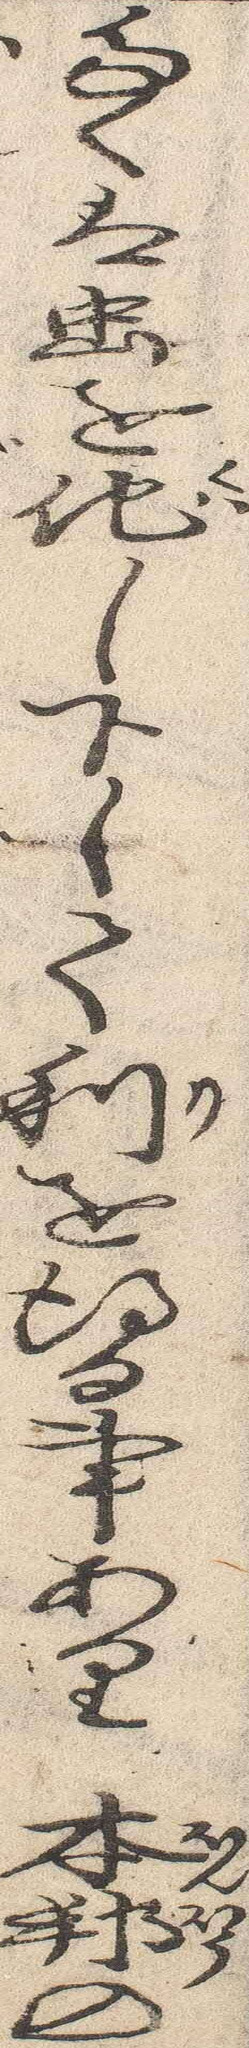多くは虫を化し下して利を得る事あり本邦の
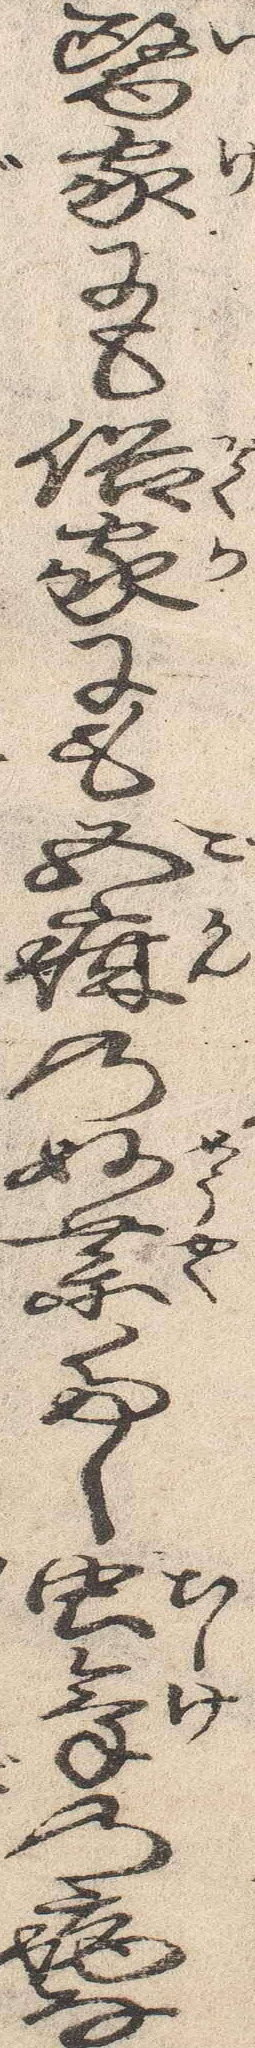医家にも俗家にも五疳の妙薬多し虫気の病な
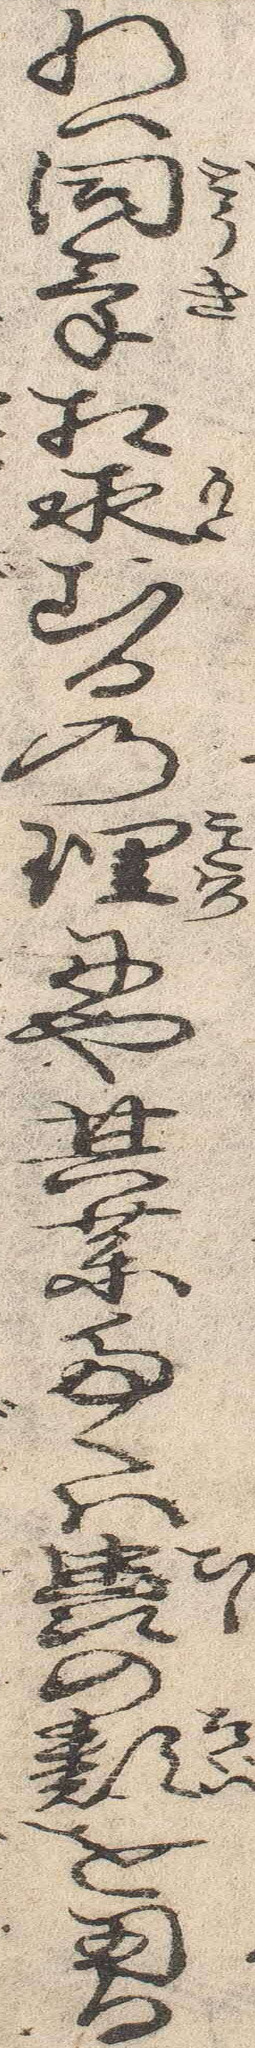れは同気相求むるの理にや其薬多くは虫の類を用る
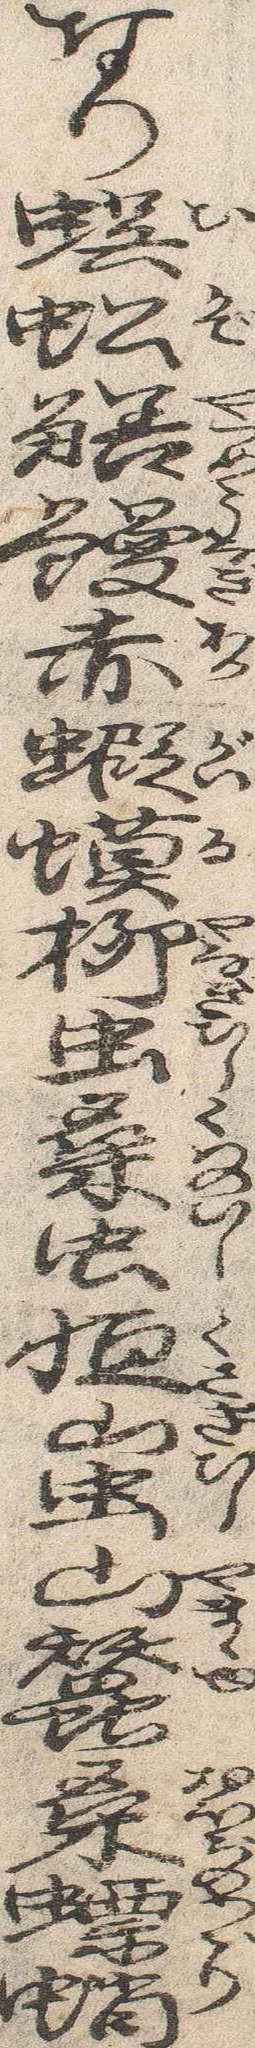なり蜈蚣鱔鰻赤蝦蟆柳虫桑虫恒山虫山蚕桑螵蛸
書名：小児必用養育草
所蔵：東京学芸大学附属図書館 国文学研究資料館
